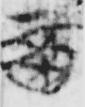酉
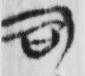司
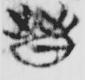晉
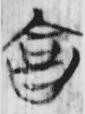亯
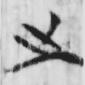之
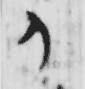人
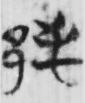求
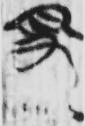○（得）
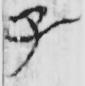子
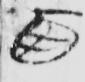西
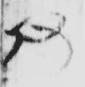尹
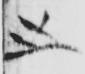之
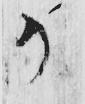人
